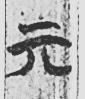亓
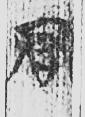君
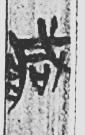戕
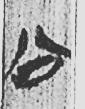公
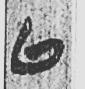㠯（以）
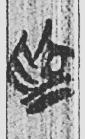爲
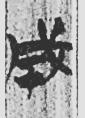成
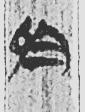於
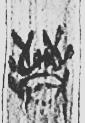晉
